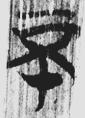不
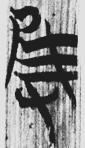隻（獲）
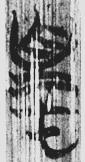辠（罪）
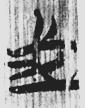或
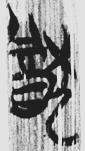猶
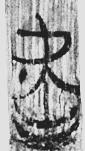害
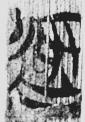趣（趨）
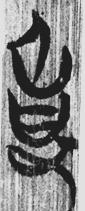事
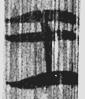王
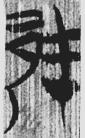邦
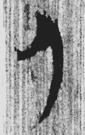人
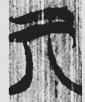亓（其）
